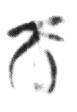而
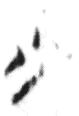少
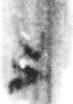之
